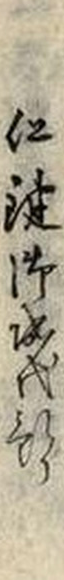但鍵御先物頭預り
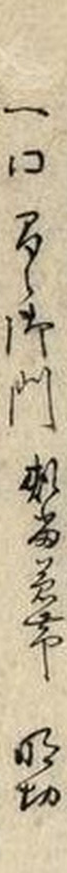一同間之御門頰当兼帯明切
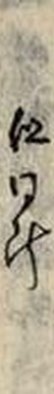但同断

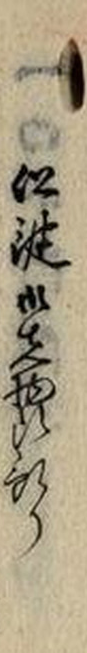但鍵御先物頭預り
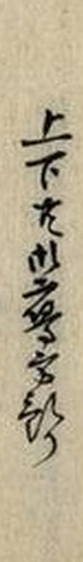上下共御鷹方預り
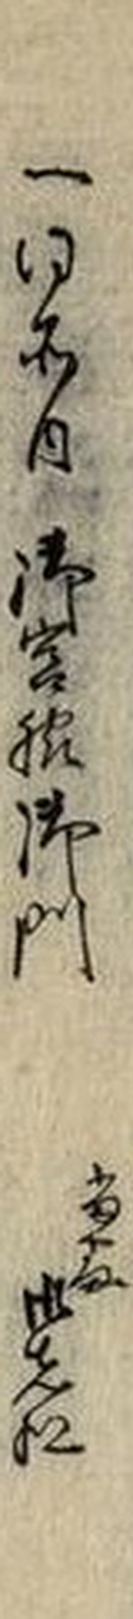一同所内御宮脇御門当番御先組
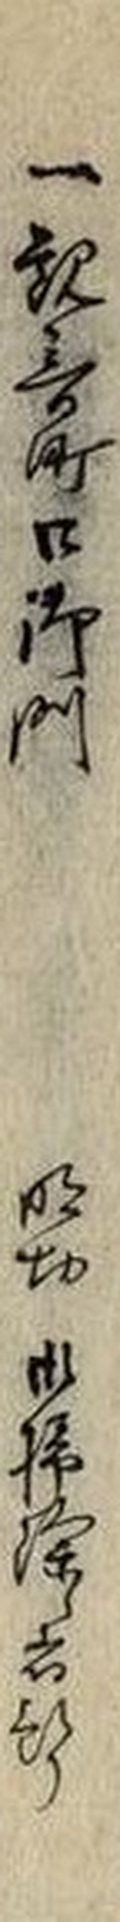一観音町口御門明切御掃除之者預り
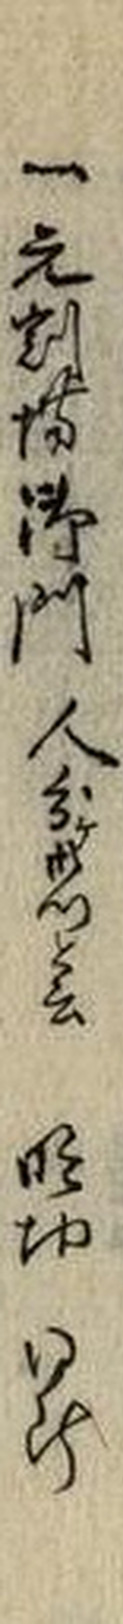一元割場御門人分ヶ御門と云明切同断
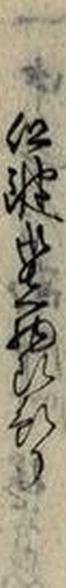但鍵御先物頭預り
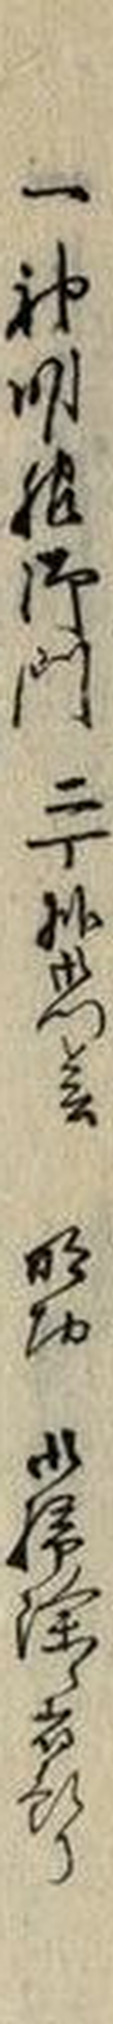一神明脇御門二丁掛御門と云明切御掃除之者預り
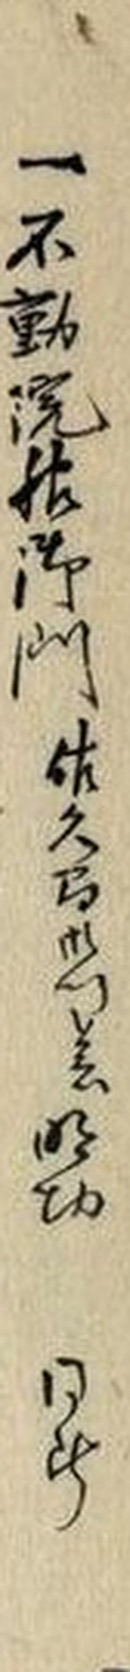一不動院脇御門佐久間御門と云明切同断
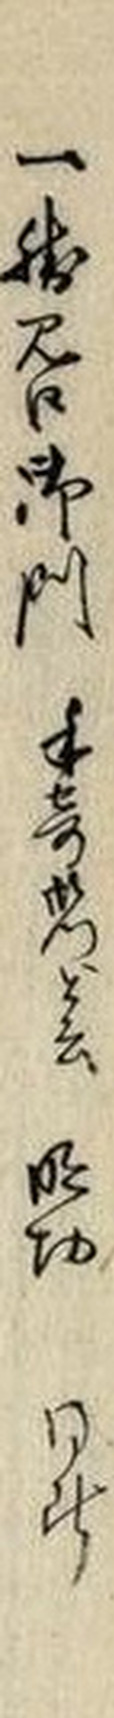一勝見口御門手寄御門と云明切同断
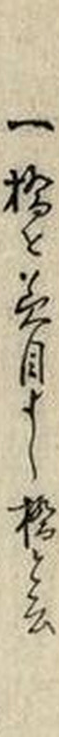一橋と美目よし橋と云
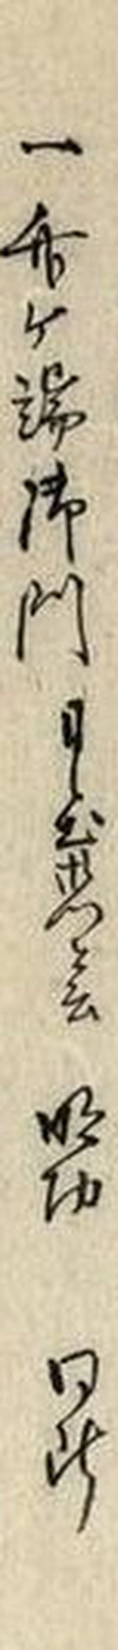一竹ケ端御門日之出御門と云明切同断
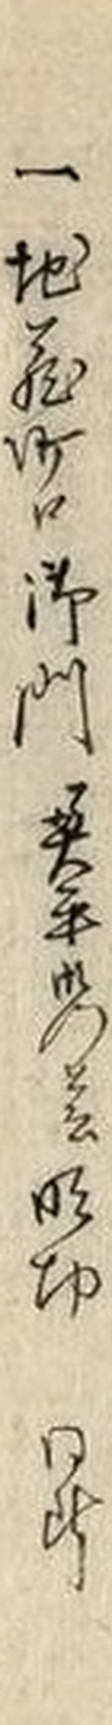一地蔵町口御門奥平御門と云明切同断
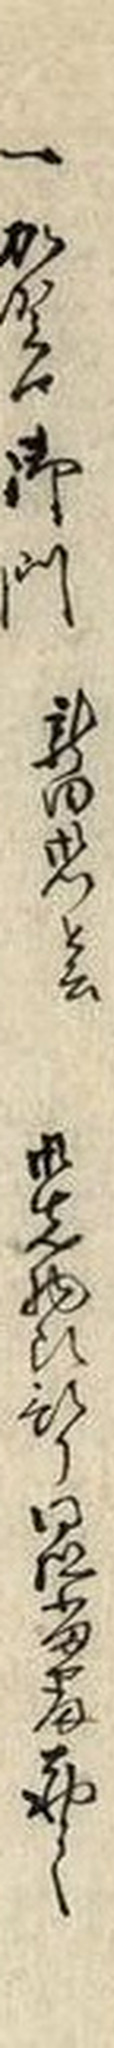一加賀口御門新田御門と云御先物頭預り同組当番勤之
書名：御門御櫓之部
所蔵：福井県文書館 Fukui Prefectural Archives
